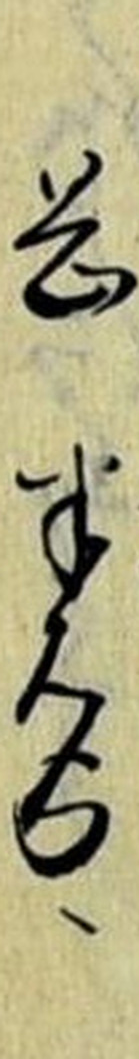岡半右衛門へ
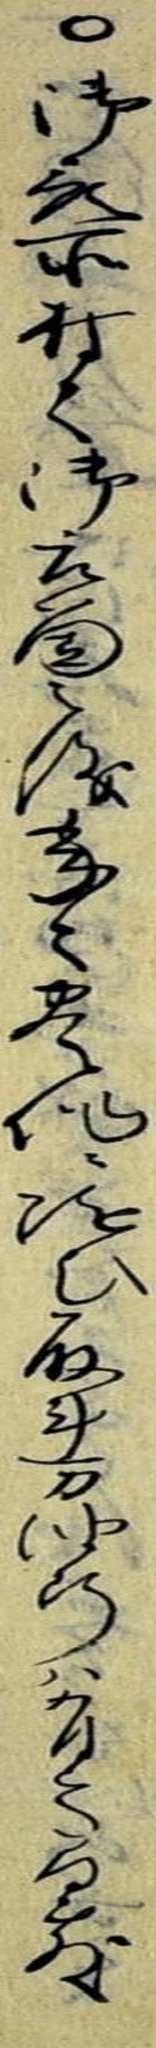〇御預所村々御取箇之儀年々豊作ニ随ひ取計方油断ハ有之間敷
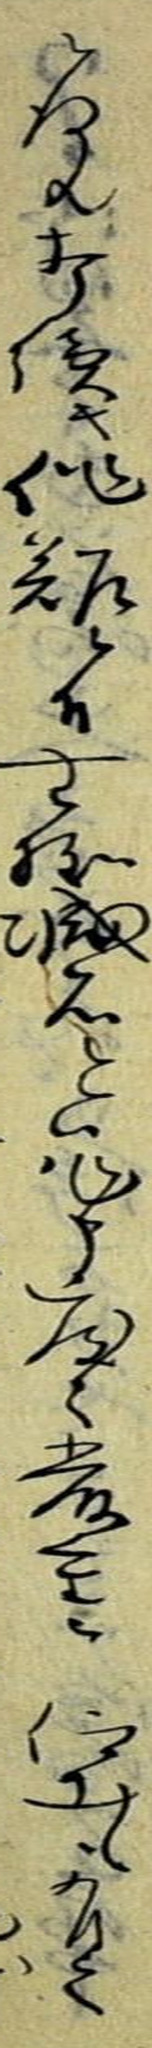候得共打続キ作難ニ付無拠減石とハ乍申度々厳重被仰出も有之
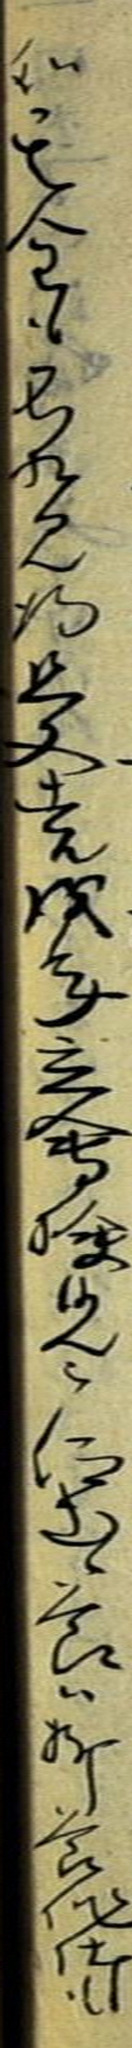処其全も不相見得且又去ル戌年立会検見被仰出候節ハ営作体も
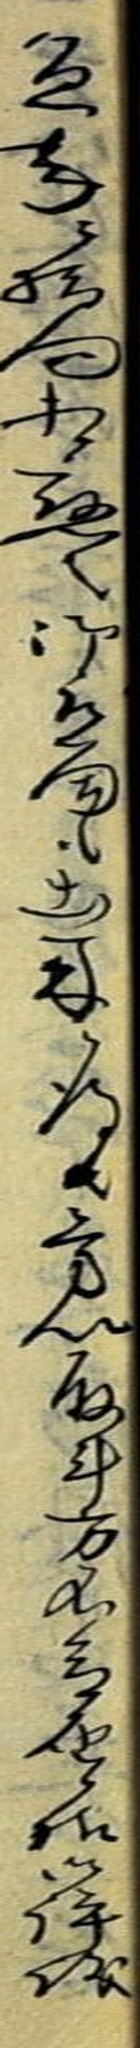宜年ニ指向相懸之御取箇も出来候得共旁以取計方不参届候様御評議
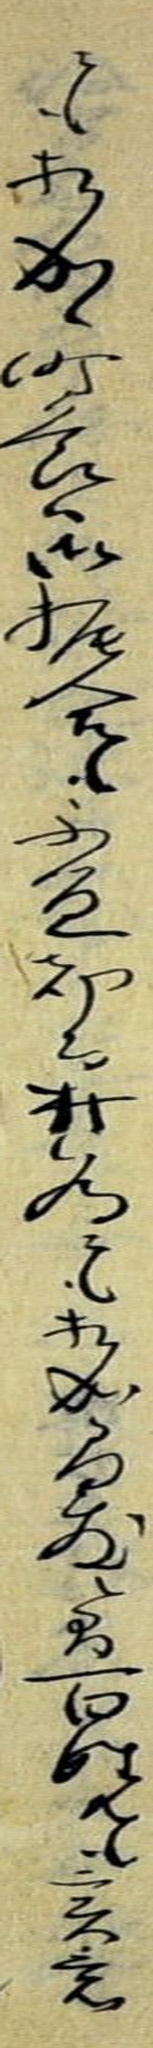ニも相成候御節ハ御振合も不宜却而村為ニも相成候間敷候間百姓共も実意
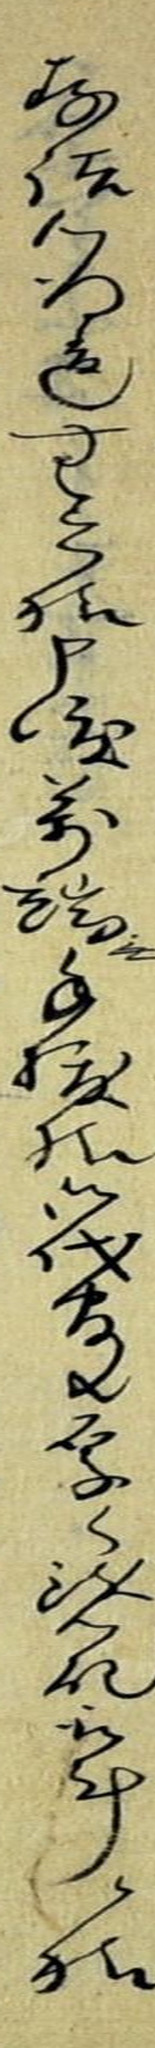存詰心得違無之様申渡万端無手抜様御代官共厚く致心配取計候様
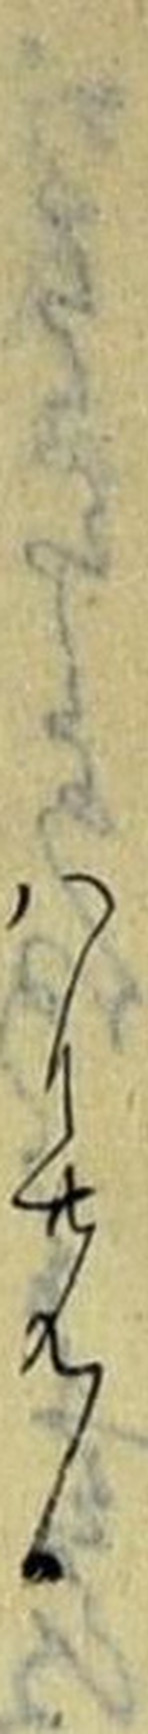八月廿九日
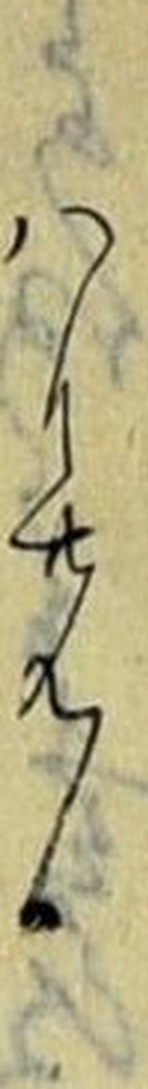八月廿九日
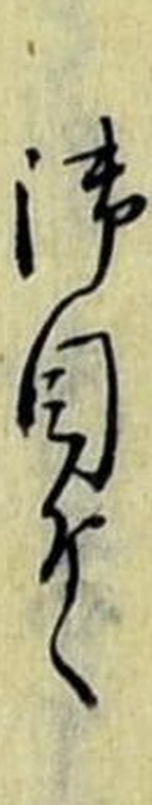御目付へ
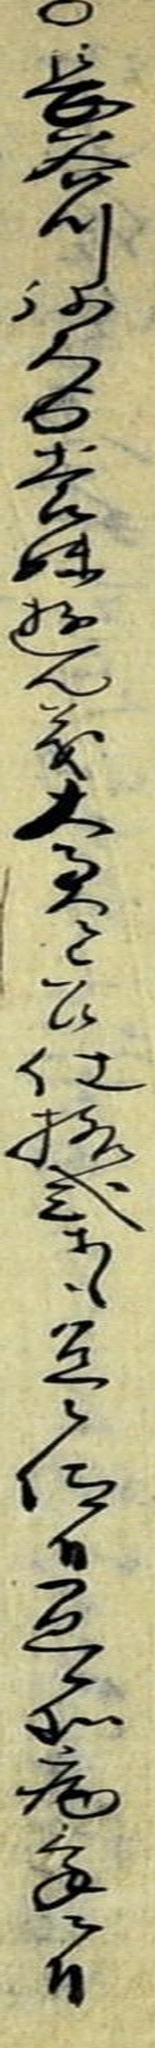〇長谷川弥右衛門養妹ゆん義大奥ニ被召仕格式等も宜被仰付置候処病気ニ付
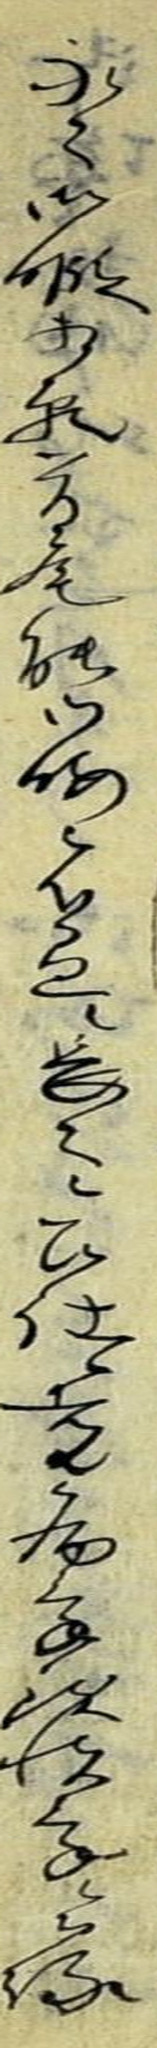永々御暇相願首尾能御暇被下置候長々被召仕候者共病気致快気候而縁
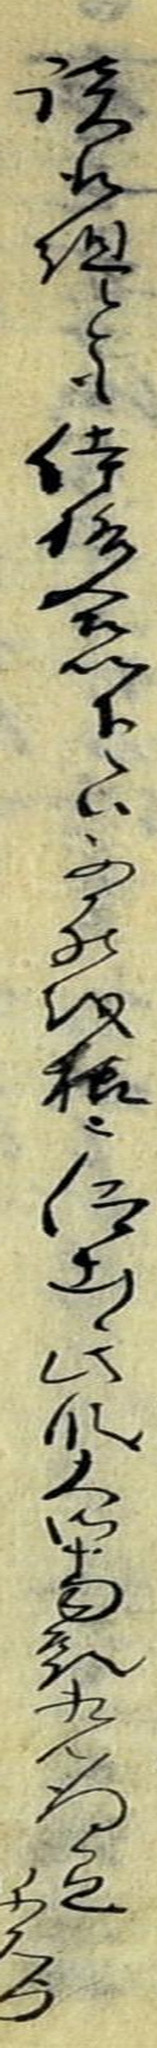談取組候とも侍格合以下ヘハ不罷越様被仰出候此段大御番頭相心得置弥右衛門
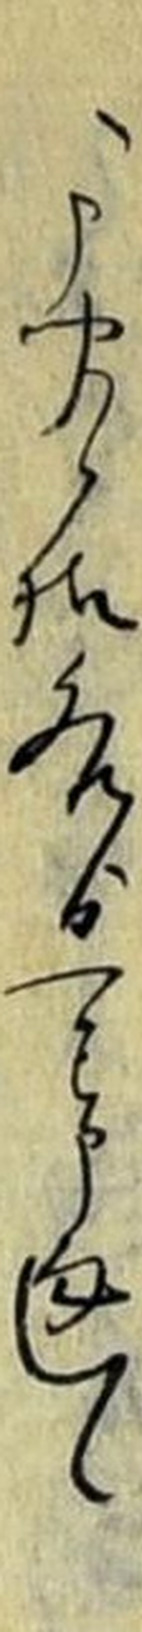へ申聞候様各ゟ可被申通候
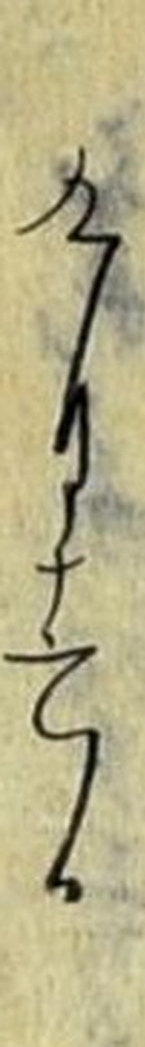九月十六日
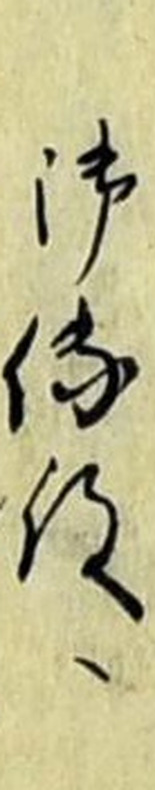御傅役へ
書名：命令之部 三
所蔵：福井県文書館 Fukui Prefectural Archives
